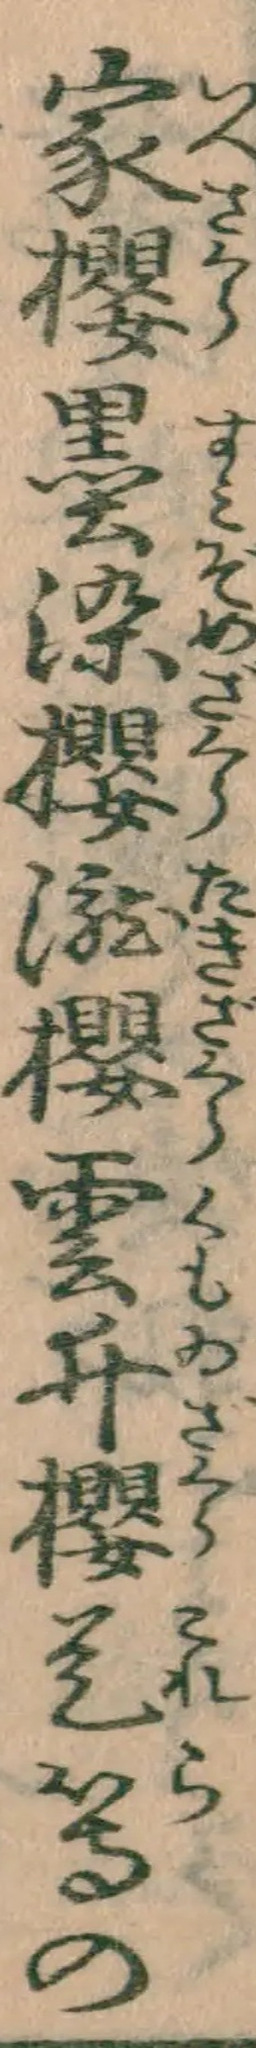家桜墨染桜瀧桜雲井桜是等の
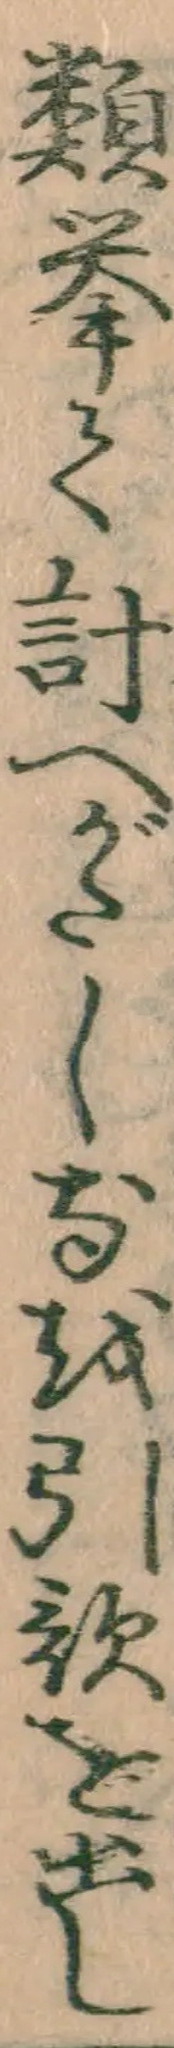類挙て計へがたしなを引歌を出し
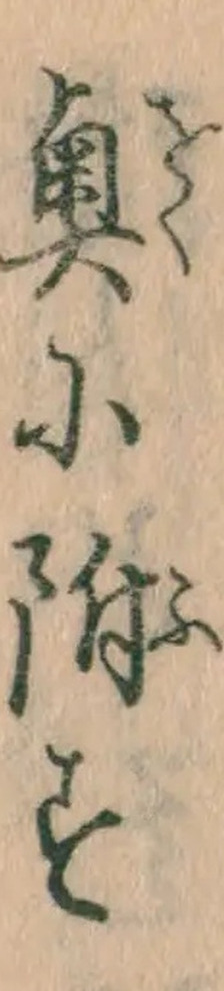奥に附す
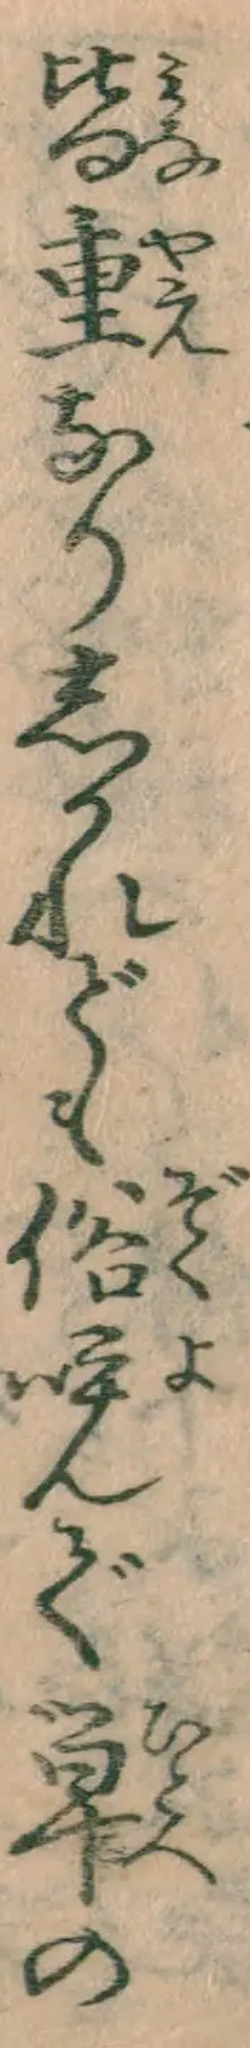皆重なりしかれども俗呼んで単の
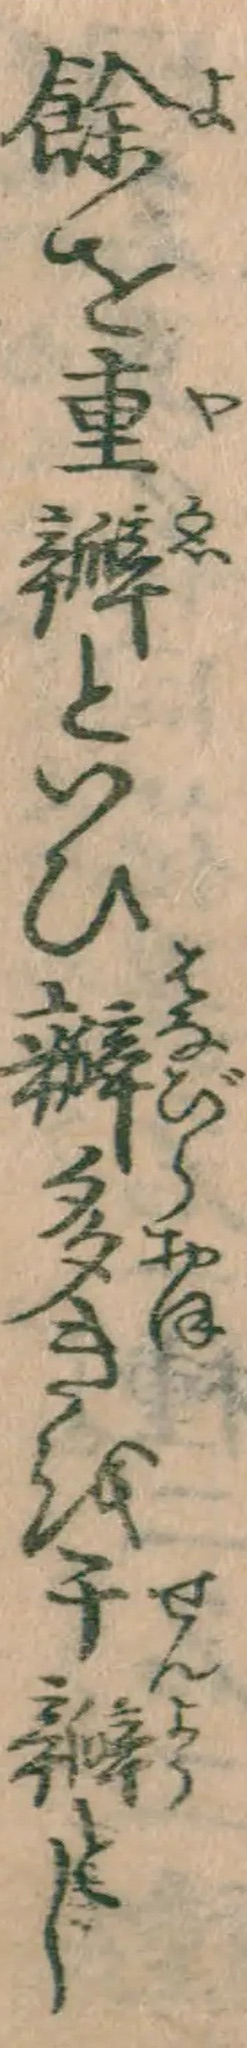余を重弁といひ弁多きを千弁とし
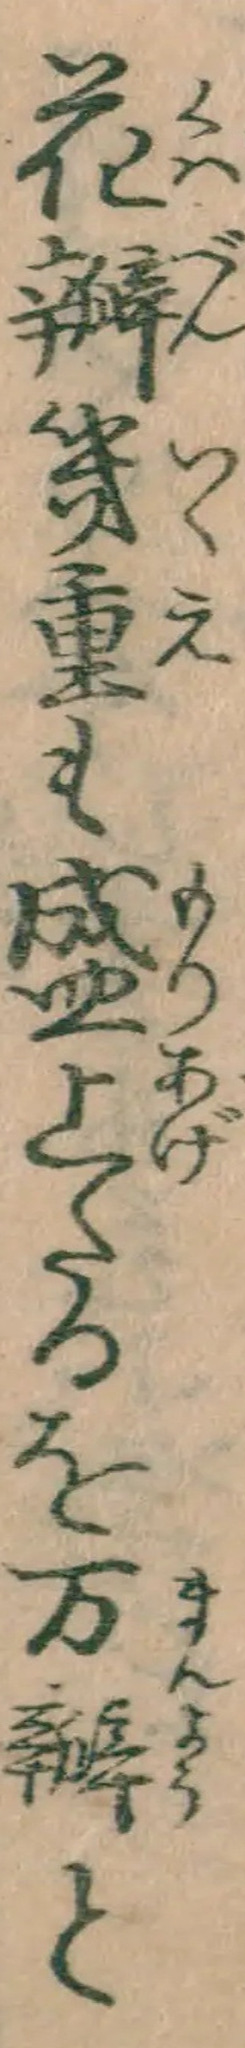花弁幾重も盛上たるを万弁と

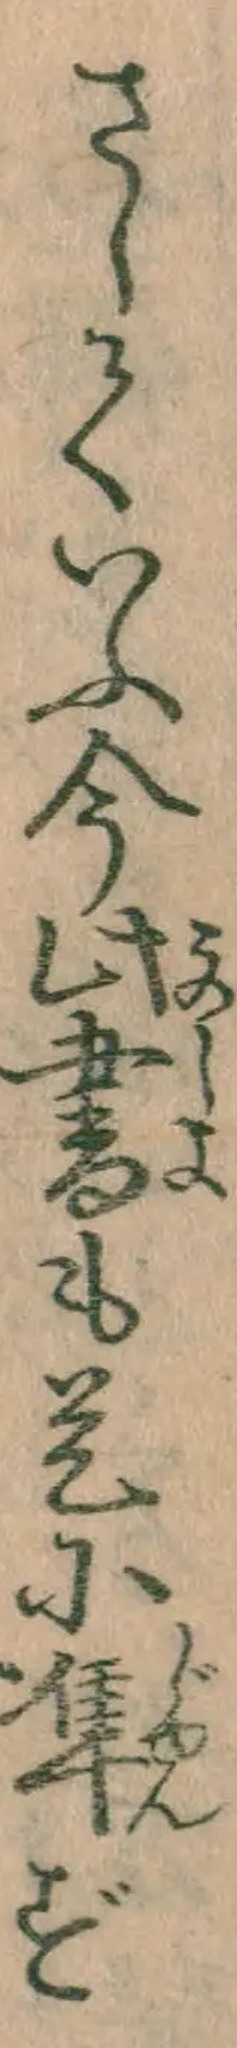さしていふ今此書も是に準ず
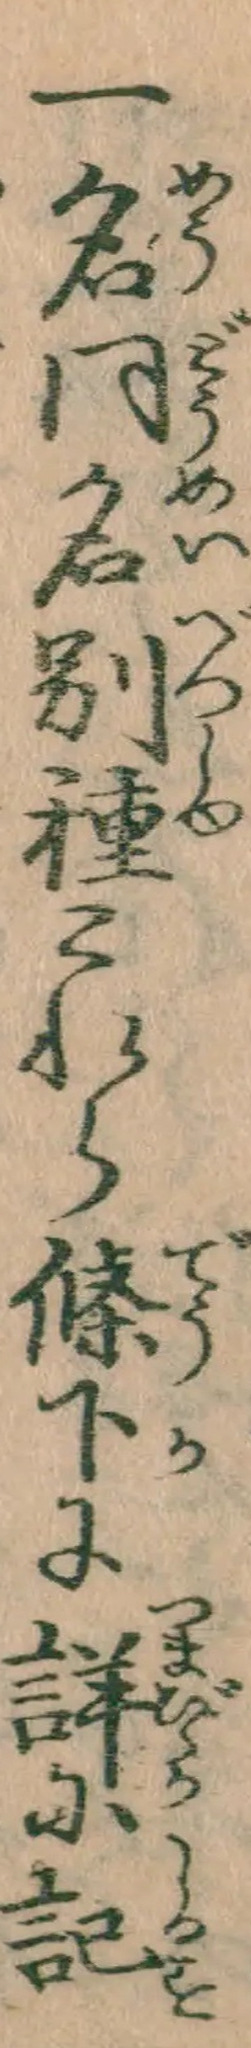一名同名別種これら條下に詳に記
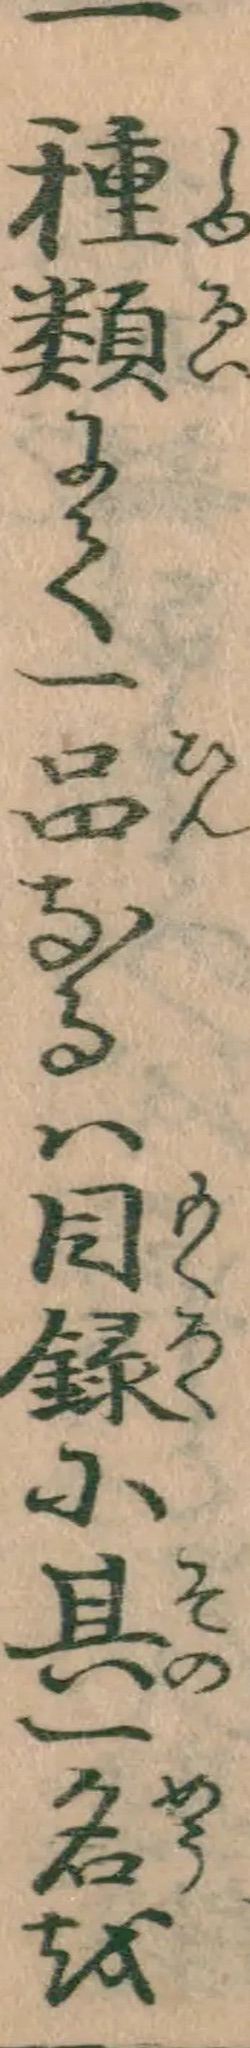一種類にて一品なるは目録に其一名を
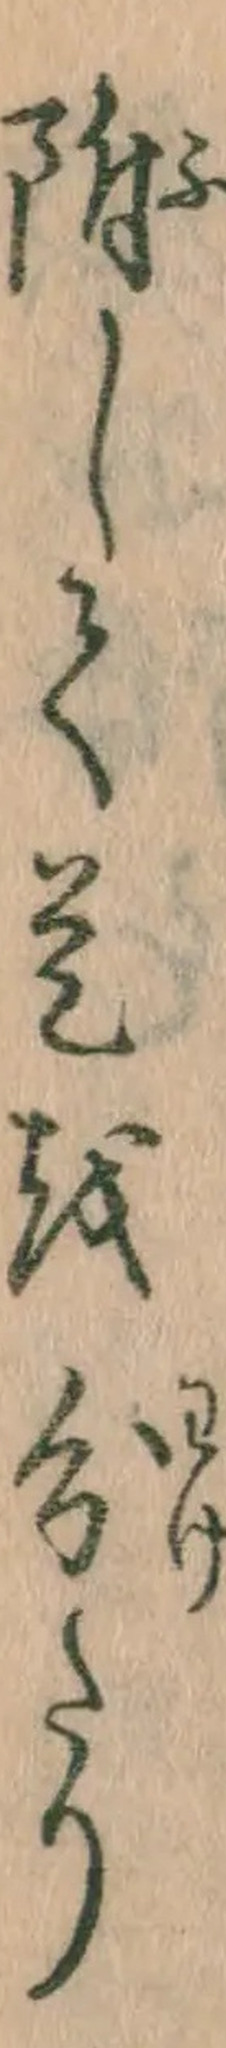附して是を分たり
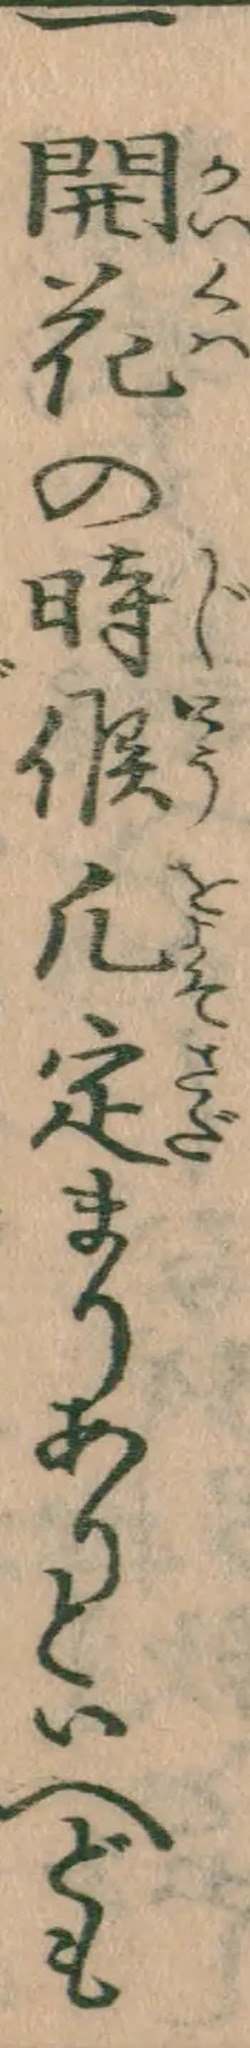一開花の時候凡定まりありといへども
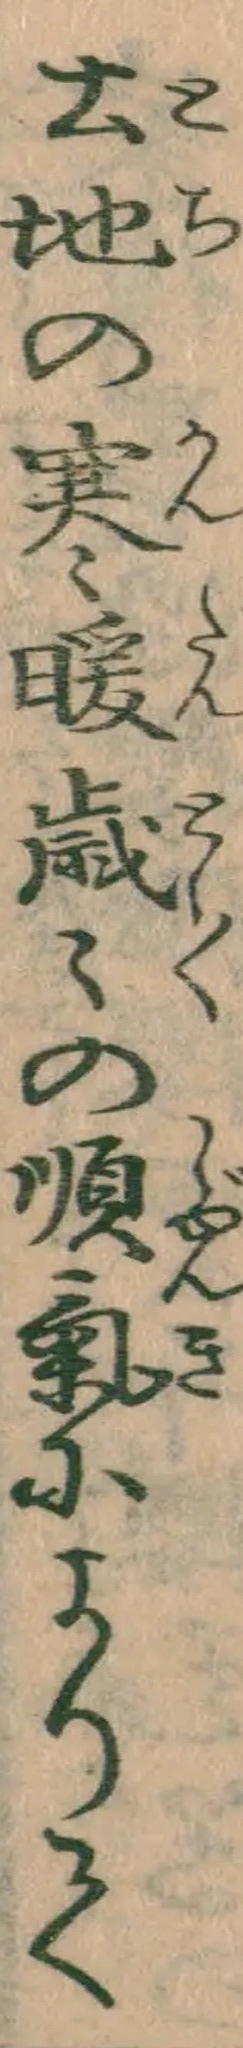土地の寒暖歳々の順気によりて
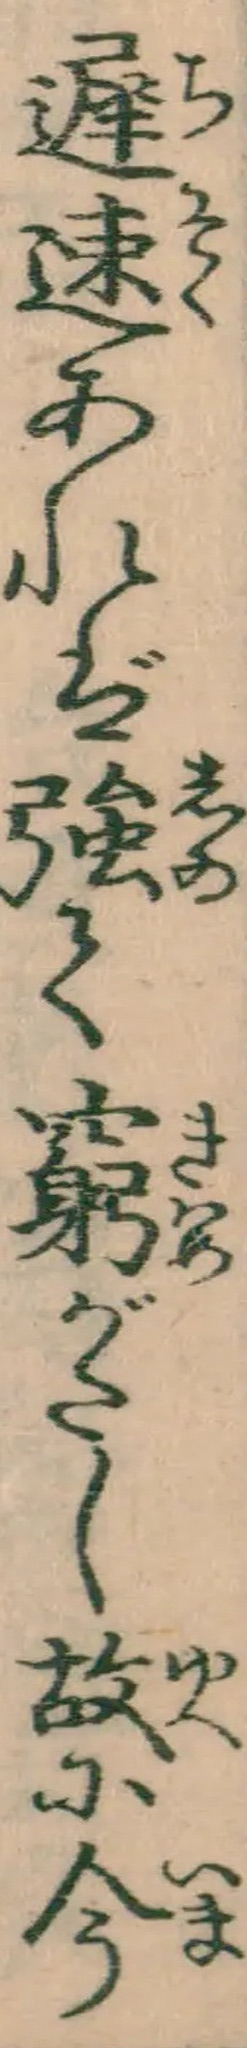遅速あれば強て窮がたし故に今
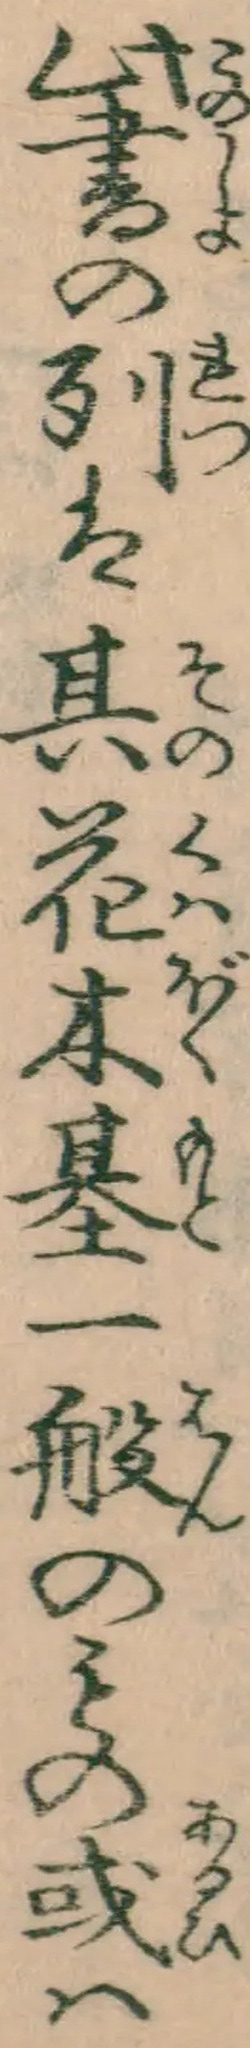此書の列は其花木基一般のもの或は
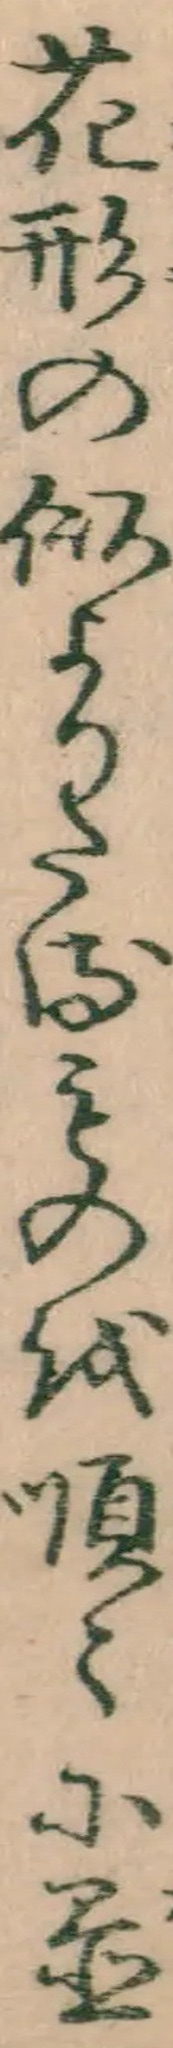花形の似よりたるものを順々に置
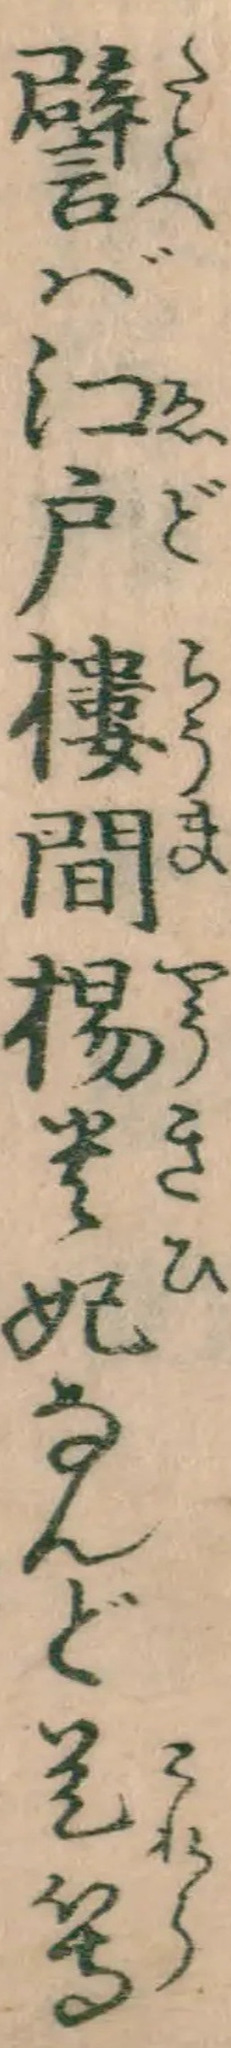譬ば江戸楼間楊貴妃なんど是等
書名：怡顔齋櫻品
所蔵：国立国会図書館 National Diet Library, JAPAN
